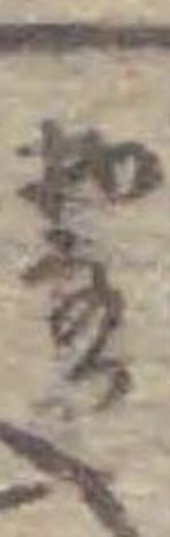女なり
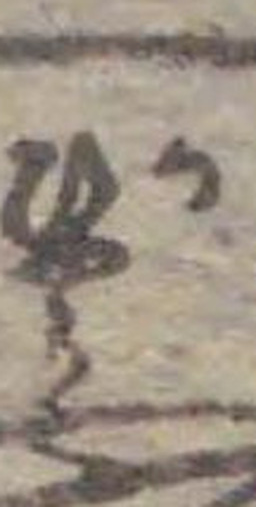ひやう
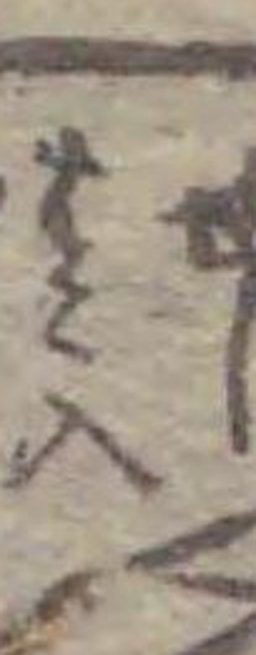はこ入
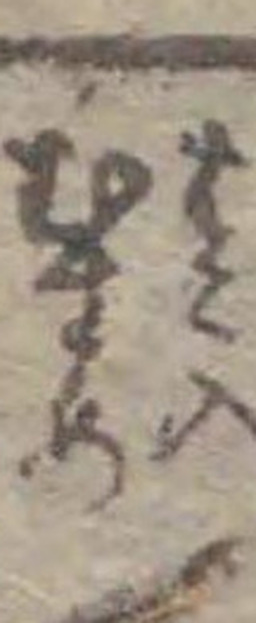むすめ
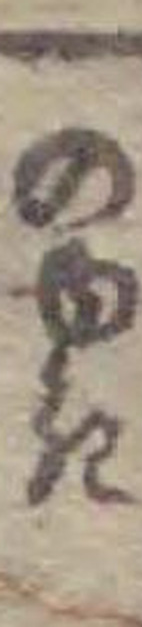のゆき
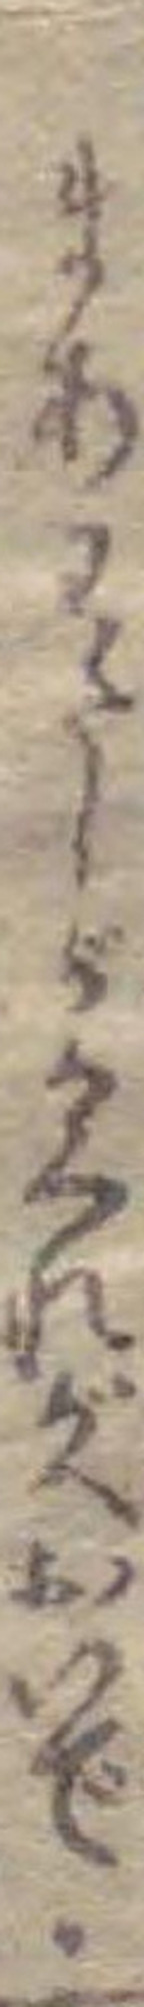まあわたしがかくれがへおいで
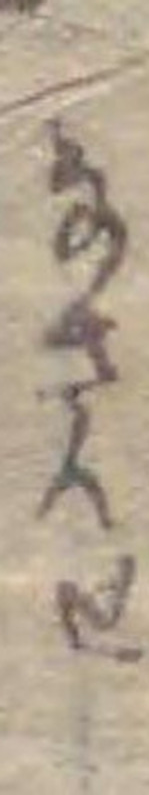なさんせ

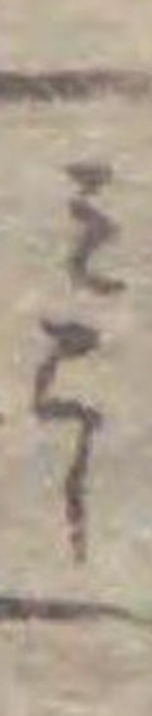みこし
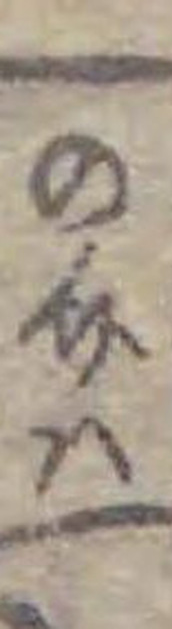の介は
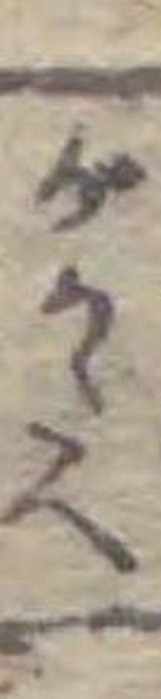がかたへ
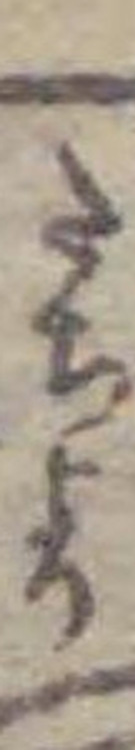たちより
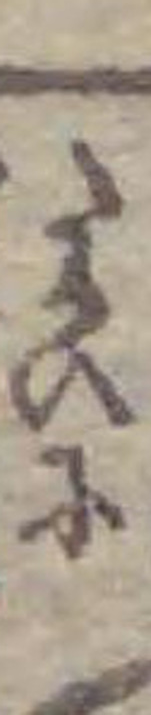たかいに
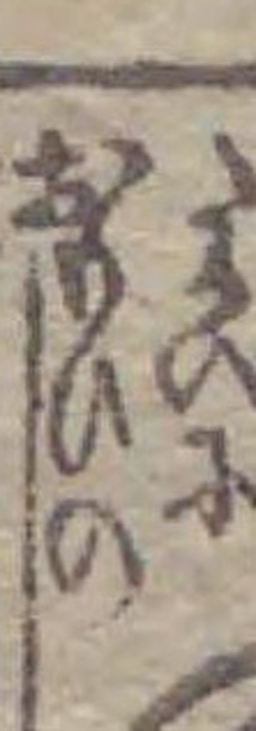おもひの
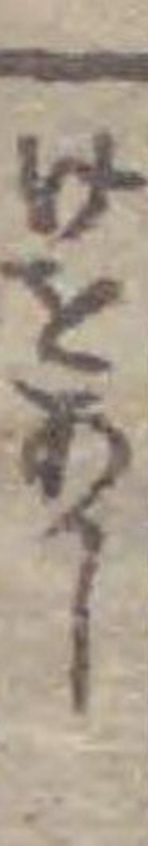けをあかし
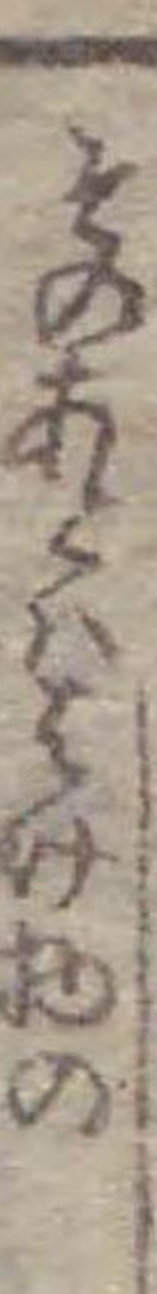そのあとははけ物の
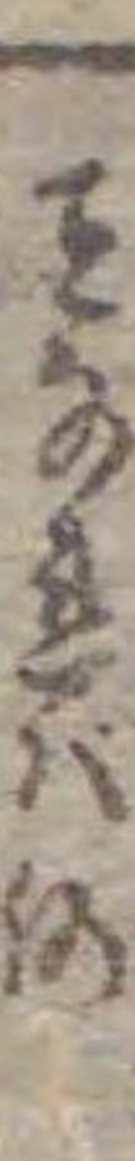ことなれば何
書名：[化物一代記] : 5巻
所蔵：国立国会図書館 National Diet Library, JAPAN
